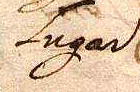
Lugar
